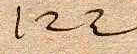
122
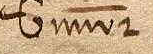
Snn̄or
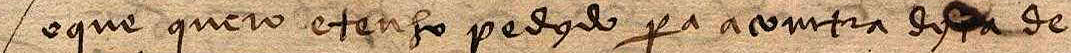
o que quero e tenho pedydo ꝑa a comtradyta de
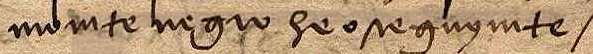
momtenegro he o seguymte /
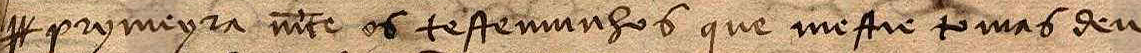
item prymeyramte os testemunhos que mestre tomas deu
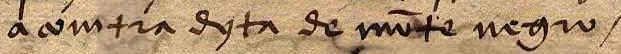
a comtradyta de mōtenegro /
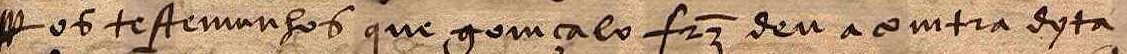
item os testemunhos que gomçalo frz̄ deu a comtradyta
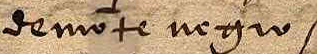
de mōtenegro /
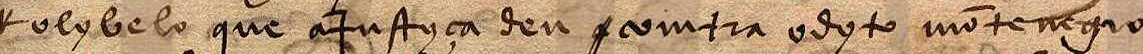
item o lybelo que a Justyça deu a comtra o dyto mōtenegro
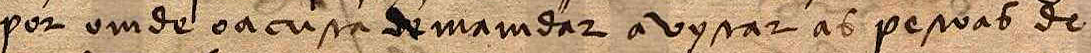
por omde o acusa de mamdar avysar as pesoas de
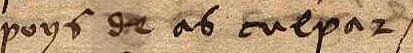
poys de as culpar /
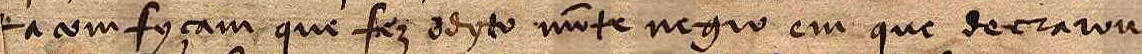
a comfyçam que fez o dyto mōtenegro em que decrarou
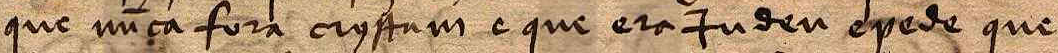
que nūca fora crystam e que era Judeu e pede que
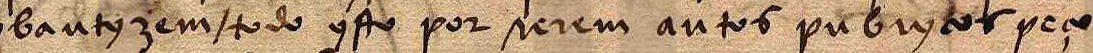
o bautyzem / todo ysto por serem autos pubrycos peço
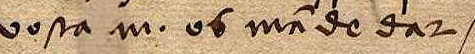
vossa m. os māde dar /
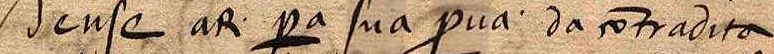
dense a R. ꝑa sua ꝓua da cōtradita
